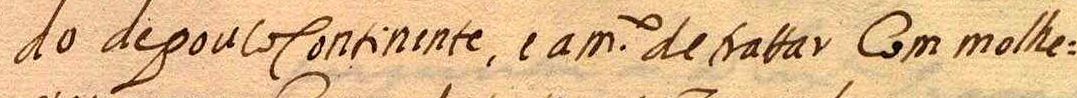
do de pouco Continente, e a m.o de trattar Com molhe
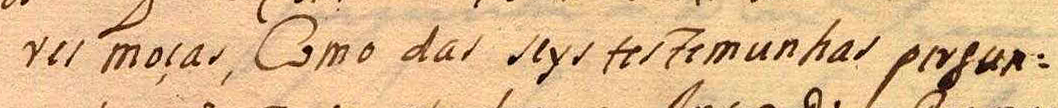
res moças, Como das seys testemunhas pergun
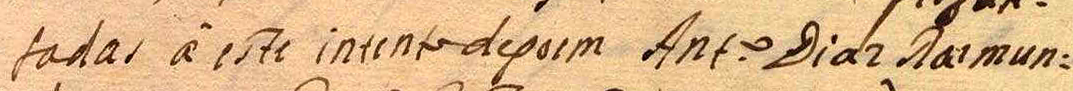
tadas à este intento depoem Ant.o Diaz Raimun
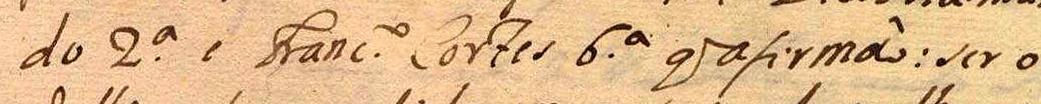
do 2.a e Franc.o Cortes 6.a q̄ afirmão: ser o
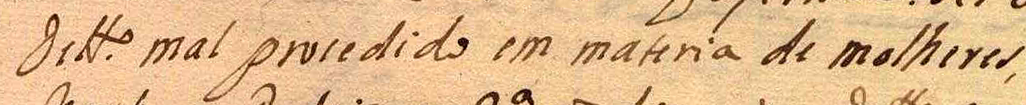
Delt.o mal procedido em materia de molheres,
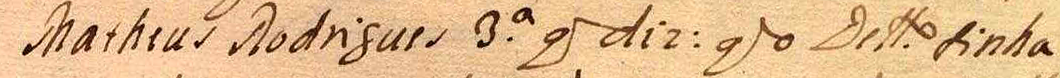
Matheus Rodrigues 3.a q̄ diz: q̄ o Delt.o tinha
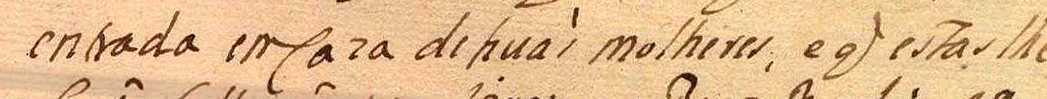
entrada em Caza de huas̄ molheres, e q̄ estas lhe
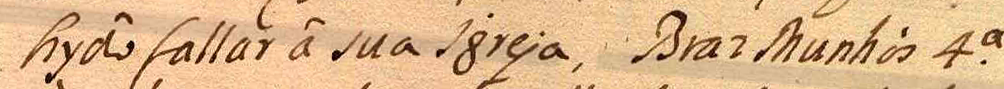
hyão fallar á sua Igreja, Braz Munhós 4.a
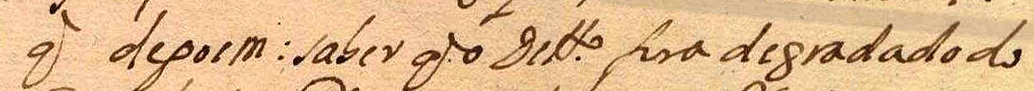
q̄ depoem: saber q̄ o Delt.o fora degradado do
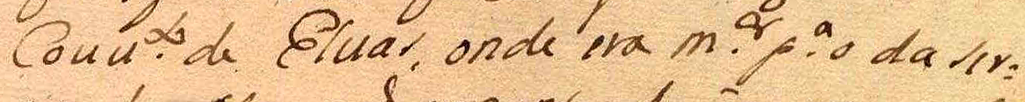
Conu.to de Eluas, onde era m.or p.a o da ser
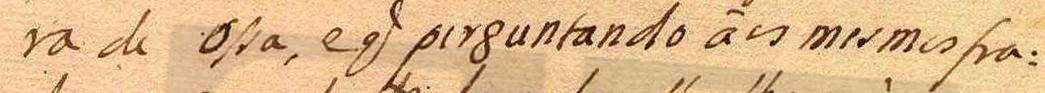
ra de ossa, e q̄ perguntando aos mesmos fra
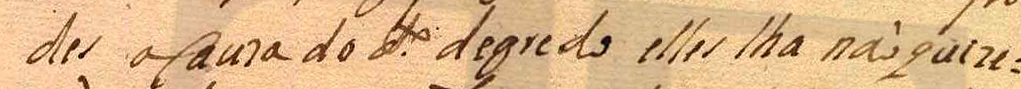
des a Cauza do d̄.o degredo elles lha naõ quize
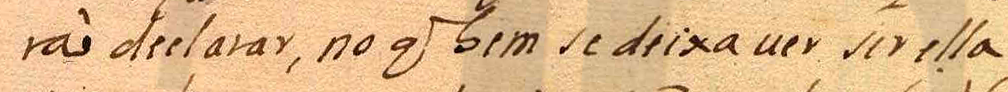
raõ declarar, no q̄ bem se deixa uer ser ella
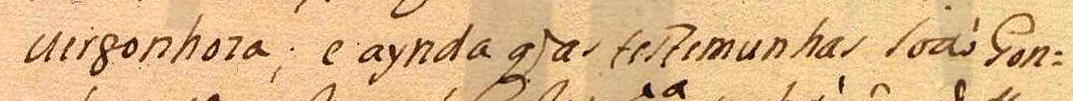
uergonhoza; e aynda q̄ as testemunhas Ioaõ Gon
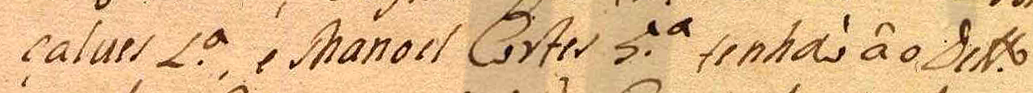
çalues 1.a, e Manoel Cortes 5.a tenhaõ áo Ditto
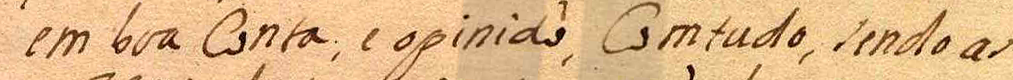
em boa Conta, e opiniaõ, Comtudo, sendo as
